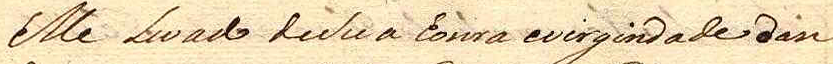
Elle levado de sua honra e virgindade dan
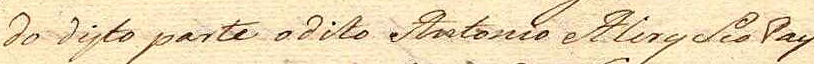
do disto parte o dito Antonio Alvres Seo Pay
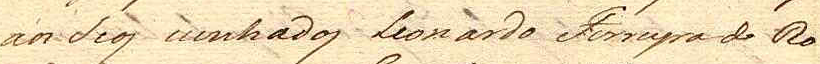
aos seos cunhados Leonardo Ferreyra do Ro
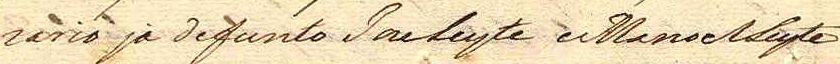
zario ja defunto Ioze Leyte e Manoel Leyte
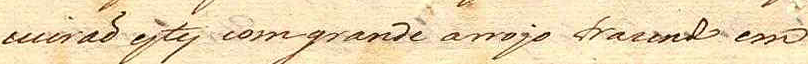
uierão estes com grande arrojo trazendo em
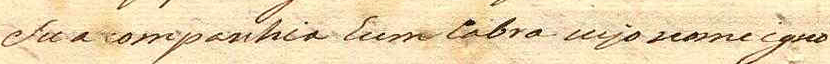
Sua companhia hum cabra cujo nome igno
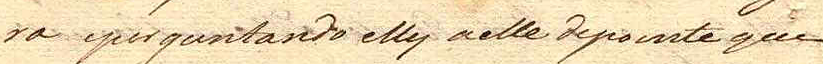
ra e perguntando elles a elle depoente que
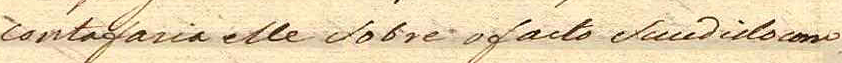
conta faria elle sobre o facto sucedido com
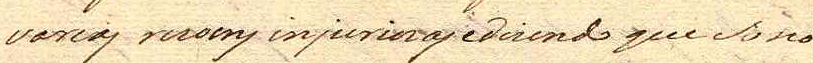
varias rezoens injuriozas e dizendo que so no
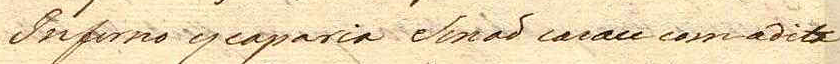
Inferno escaparia e Senão cazace com a dita
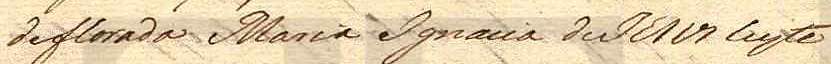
deflorada Maria Ignacia de IESUS Leyte
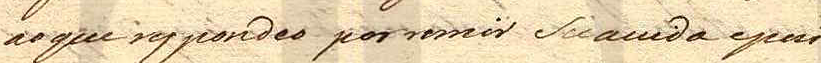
ao que respondeo por remir sua uida e peri
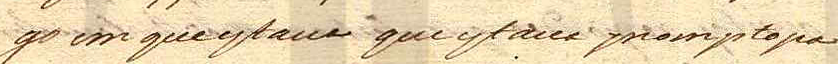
go em que estaua que estaua prompto pa
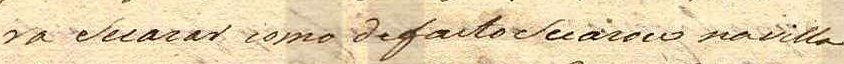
ra se cazar como de facto se cazou na villa
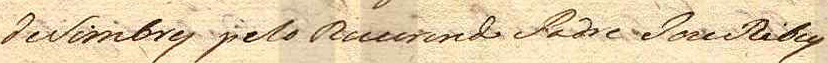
de Simbres pelo Reuerendo Padre Ioze Ribey
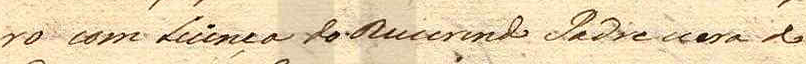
ro com Licença do Reuerendo Padre cura de
